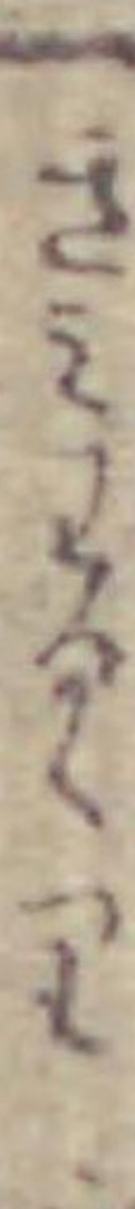きみわるくり
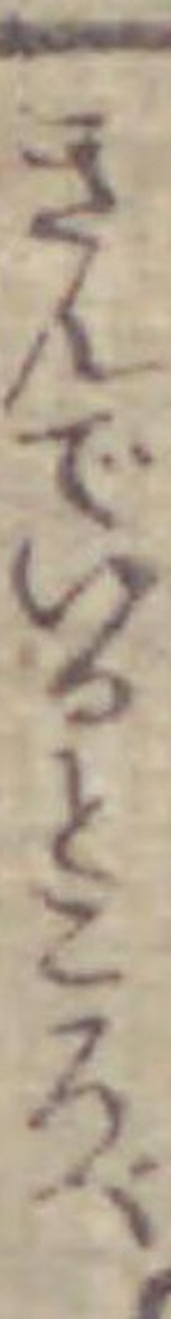きんでいるところへ
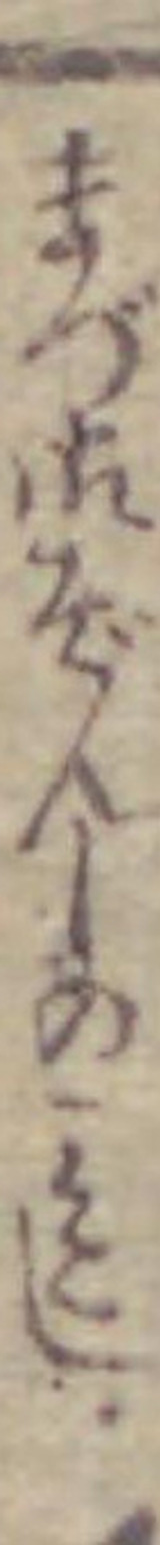まづ御ぞんしのみこし
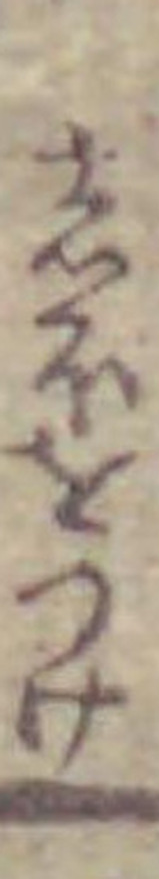しほをつけ
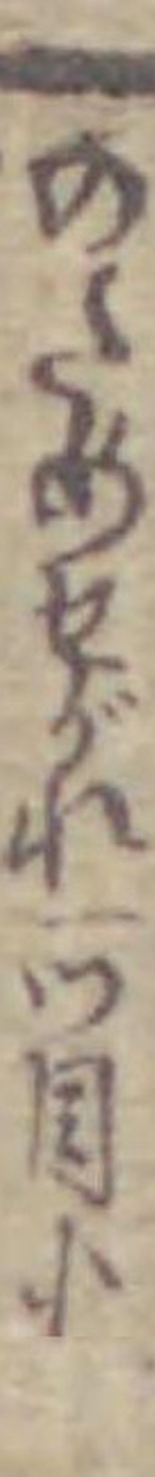のためせがれ一つ目小
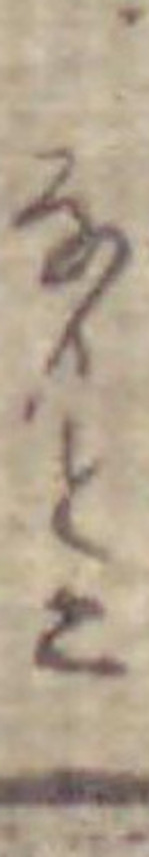なんとこ
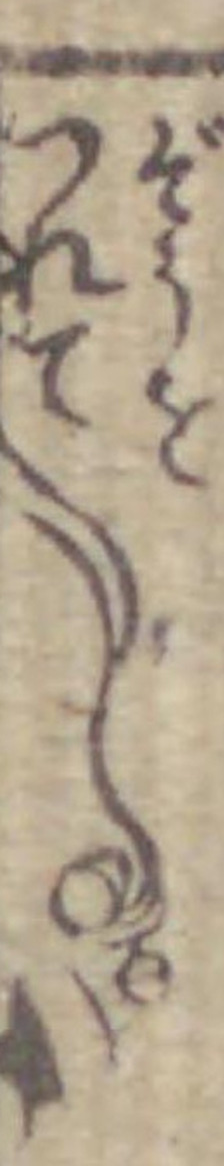つれて
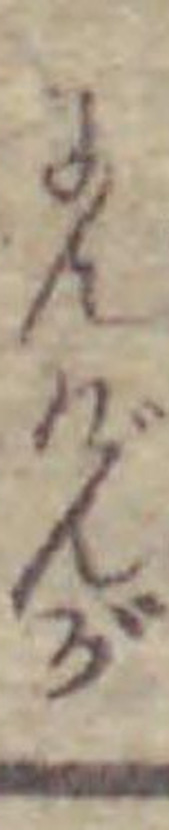にんげんが
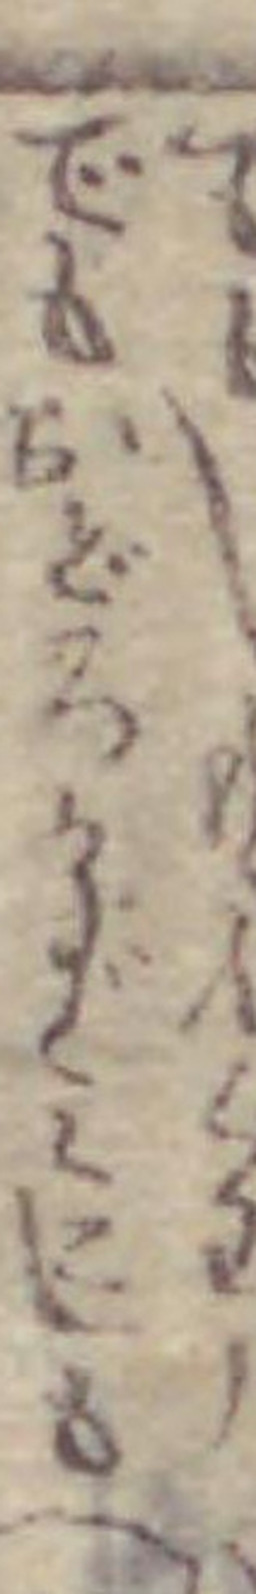でもおどろかずみこしも
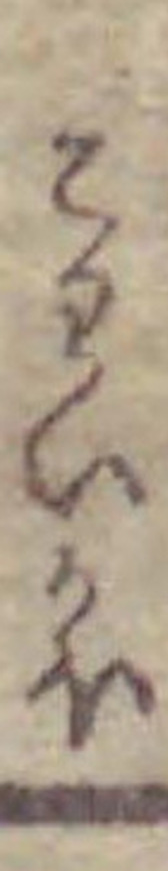こわいかほ
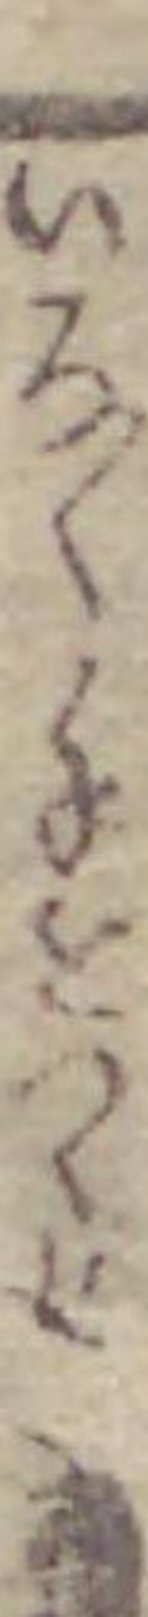いろ〳〵手をつくせ
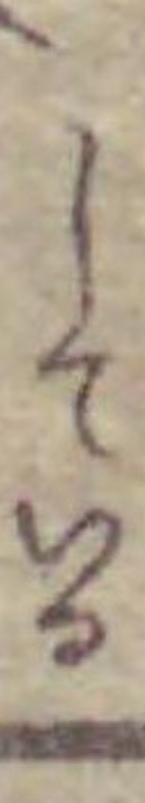している
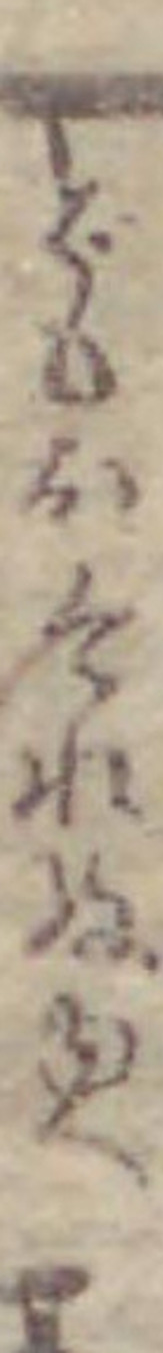どもおそれぬゆへ
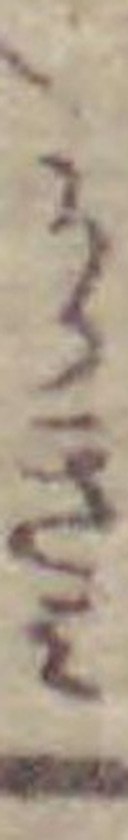からきみ
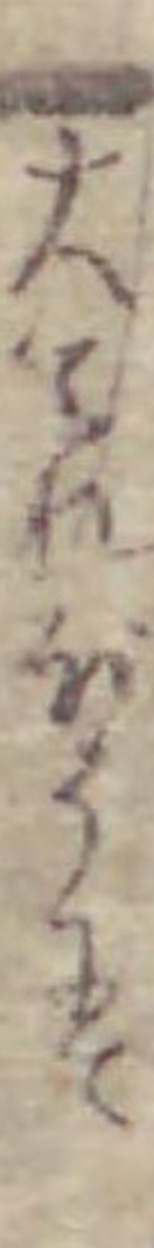大てれほうにて
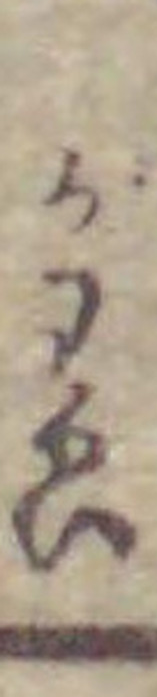がわるい
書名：二日替 : 2巻
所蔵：国立国会図書館 National Diet Library, JAPAN
